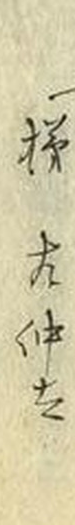梯左仲太
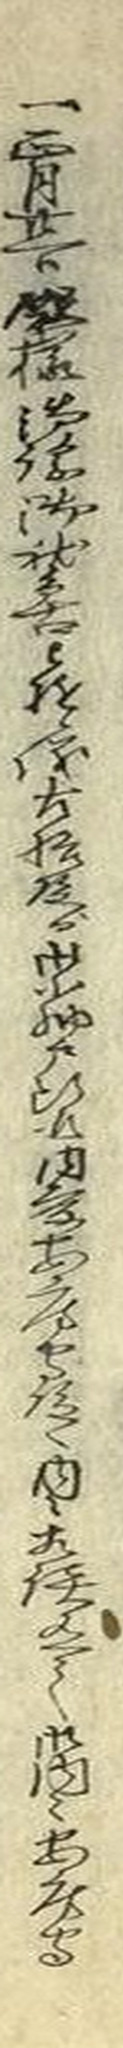一正月廿一日殿様御謡御稽古被遊候儀左膳殿ゟ御小納戸頭取内藤安房守殿へ内々相談有之御内々安房守
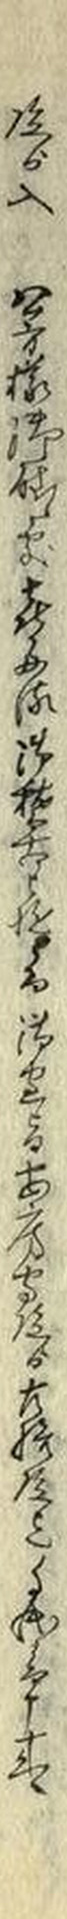殿ゟ入公方様御聴候処喜多流御稽古被遊候而御宜旨安房守殿ゟ左膳殿迄手紙ニ而申来候
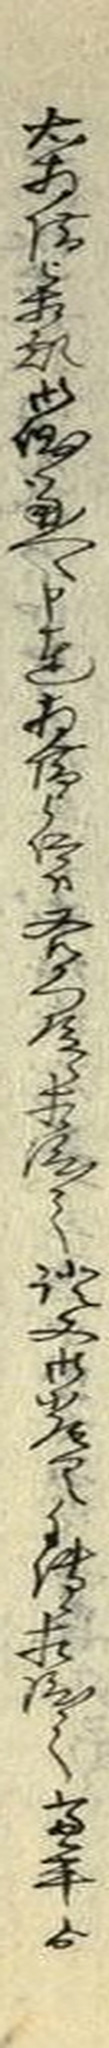右拝借被相願御側御用人申達拝借被仰付又左衛門殿へ相渡之証文御小道具手伝へ相渡之当年ゟ
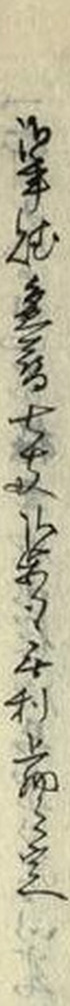弐年賦盆暮七両弐朱ツヽ無利上納之定
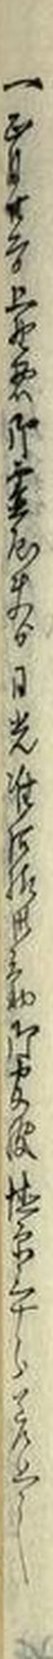一正月廿二日上野惣御霊屋夫ゟ日光准后様御勤御官服埴原三十郎差上之
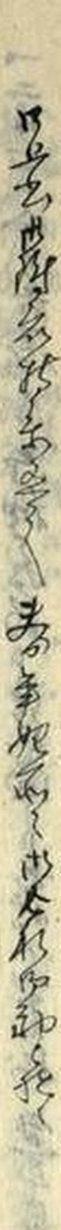口上書御附衆持参有之夫ゟ年始所々御返礼御勤被遊候
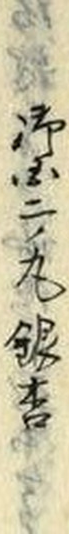御国二ノ丸銀杏
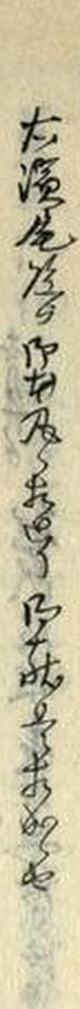右浜尾殿ゟ御本丸へ相廻り御献上ニ相成候由
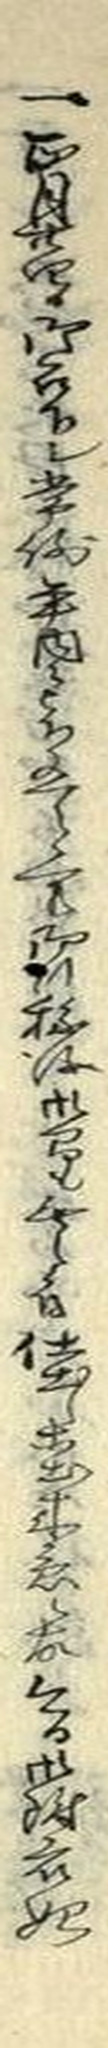一正月廿四日御召下シ常例年内ニ被下有之候へ共御引移後御間も無之ニ付仕出し等出来兼候故今日御附衆始
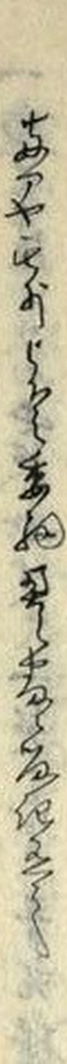両部屋其外被下之委細奥之番ニ留記有之
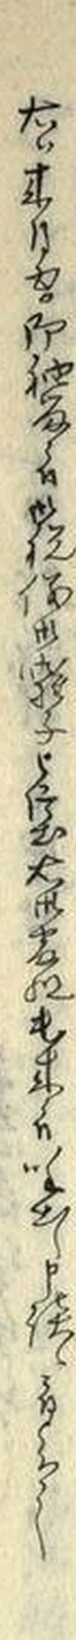右ハ来月五日御袖留ニ付御祝儀御囃子被仰出右御番組出来ニ付呼出し申談候ニ付被下之
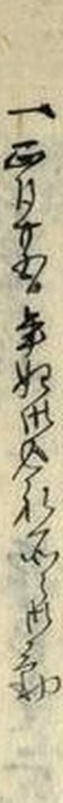一正月廿五日年始御返礼所々御勤
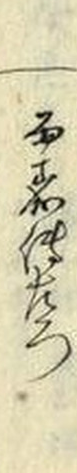雨森伝左衛門
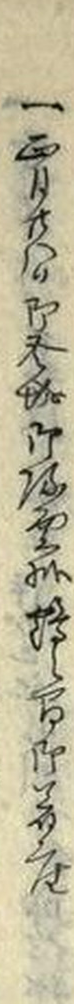一正月廿八日御登城御帰殿掛鶴之間御着座
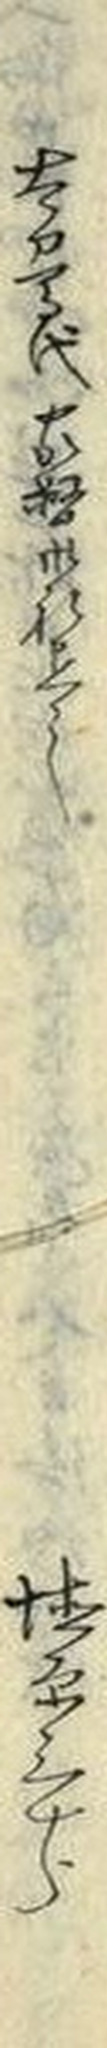太刀馬代家督御礼申上之埴原三十郎
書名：少傅日録抄（斉善付側向頭取日記、在府）
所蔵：福井県文書館 Fukui Prefectural Archives
